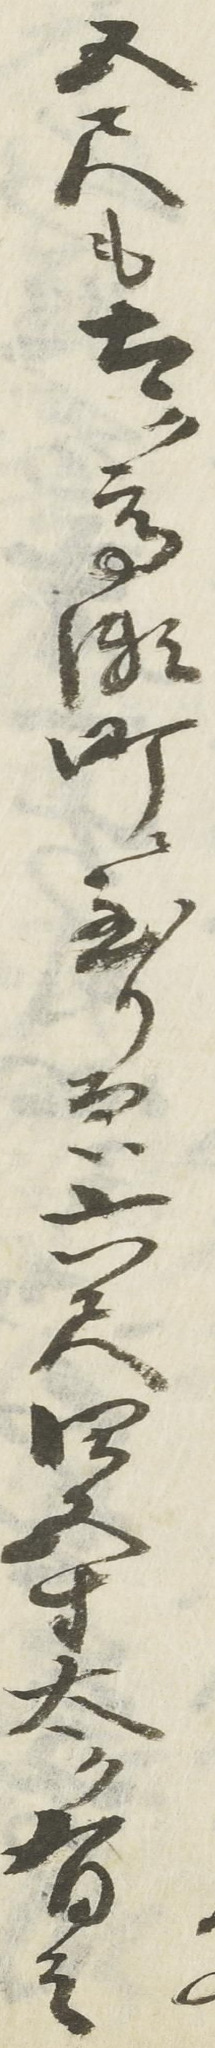五尺も太ク高瀬町ニ至り而は六尺四五寸太ク有之
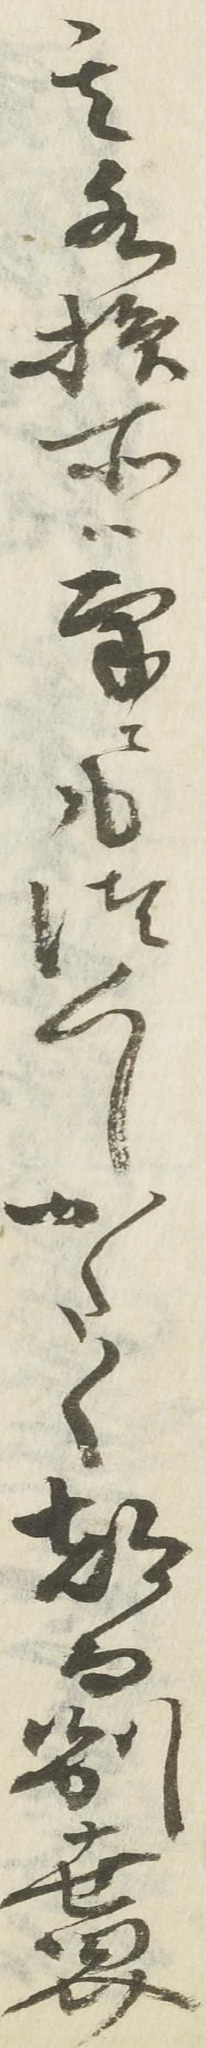其水損所は筆にもつくしかたく都而別世界
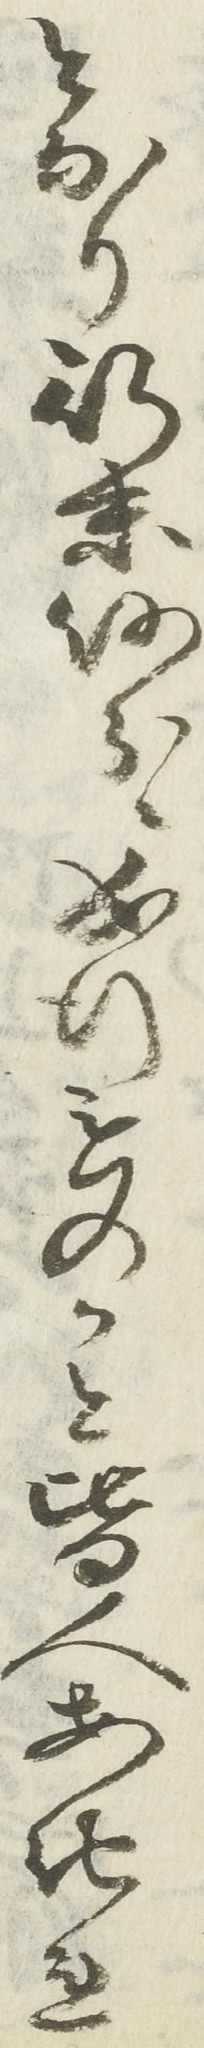となり行末何分成行ものかと皆人あゆれ
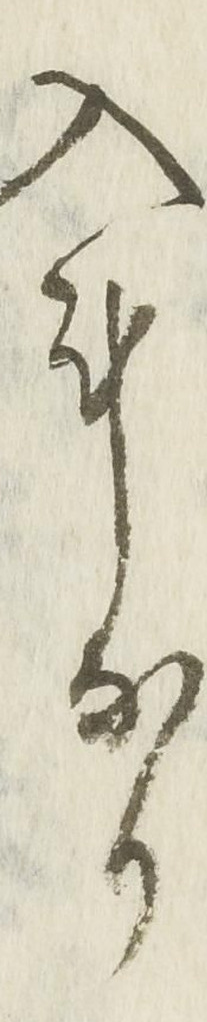入計なり
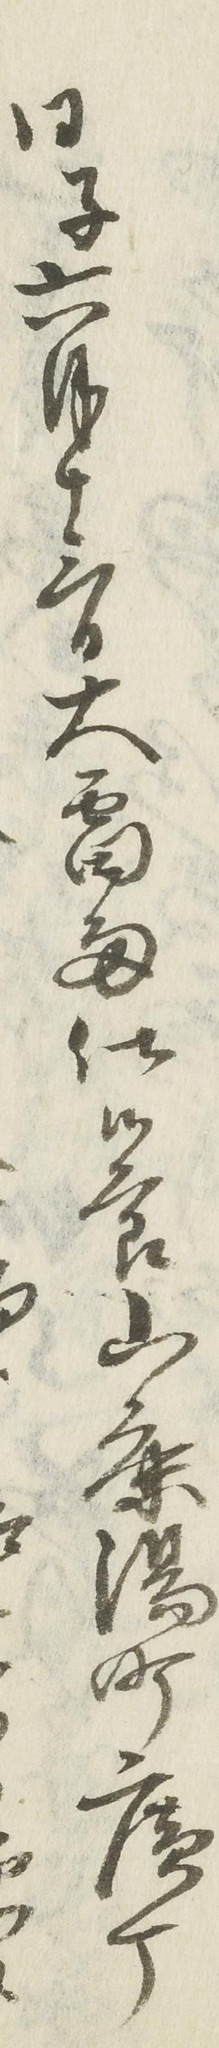一同子六月十三日大雷雨仕候節山鹿湯町広丁
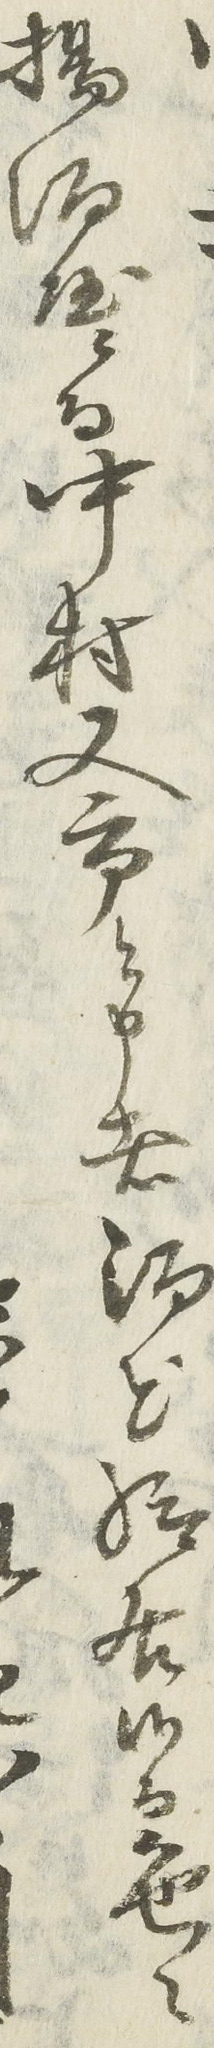揚仮屋ニ而中村又市と申者酒を給居候而色々
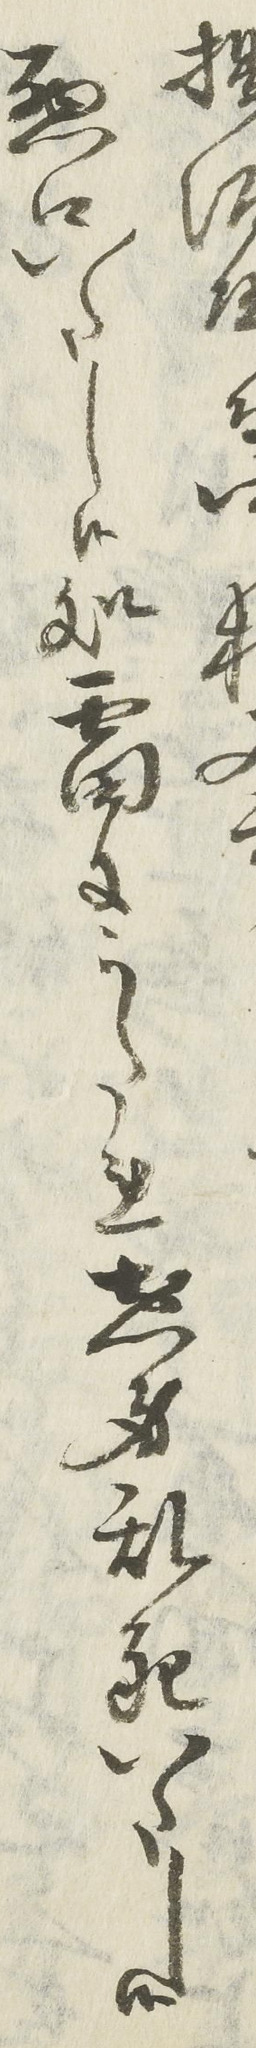悪口いたし候処雷にうたれ惣身乱死いたし候
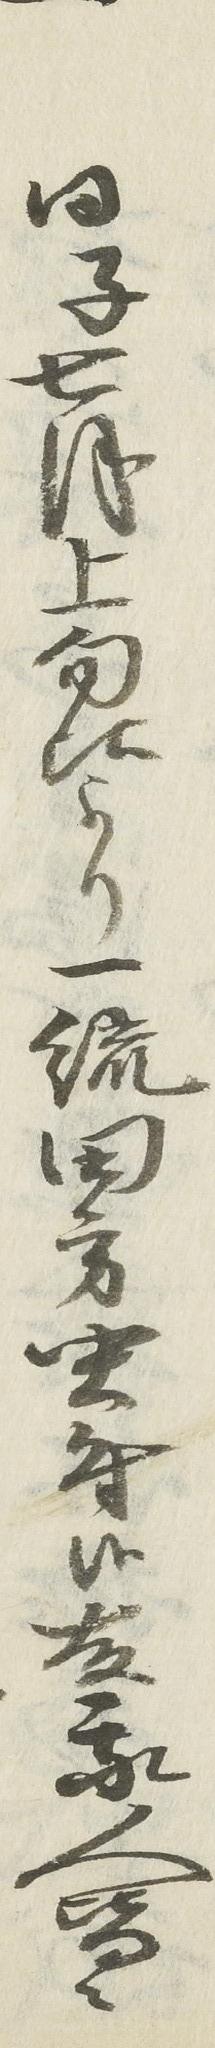一同子七月上旬比より一統田方虫付候故我人皆々
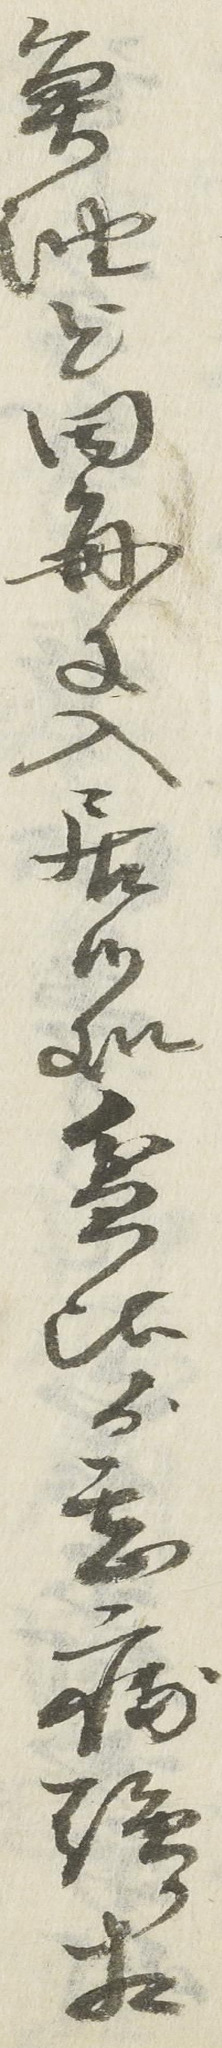魚油を田舟に入居候処盆比ゟ甚病強り相
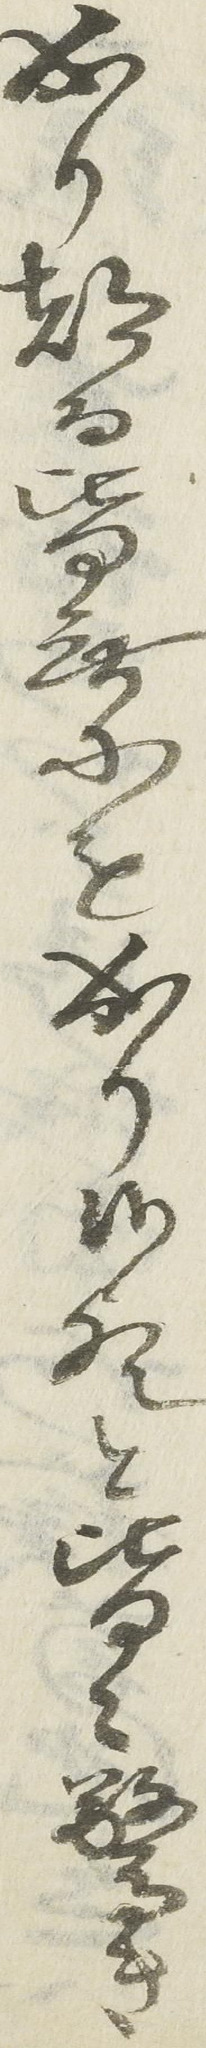成り都而皆無にと成り候歟と皆々驚き
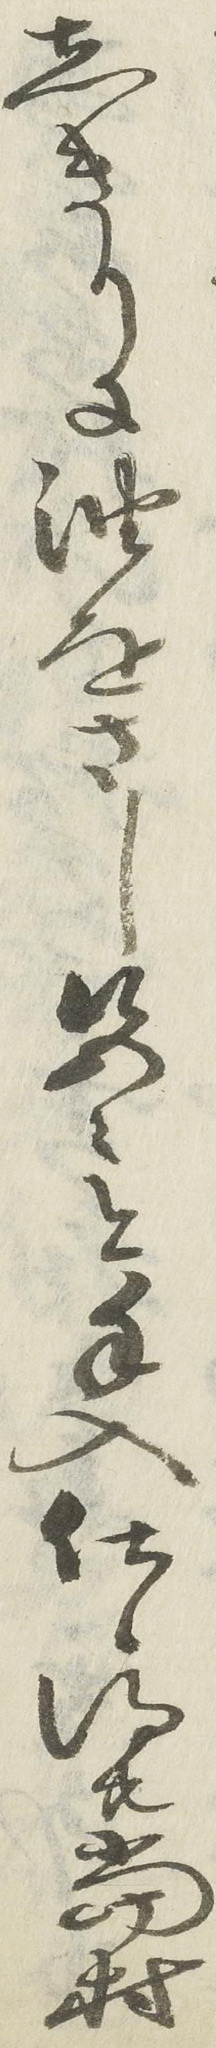しきりに油をさし色々と手入仕候得共当村
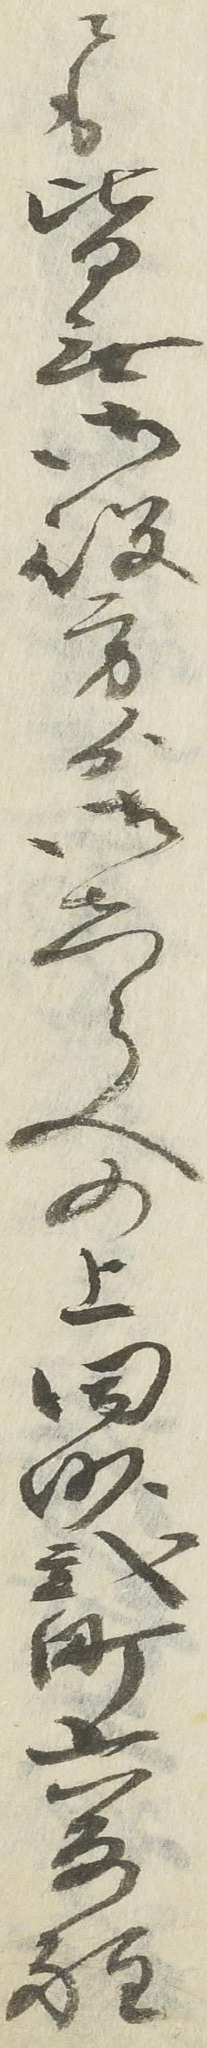ニも皆無御役方ゟ御しらへの上田畝弐町六反程

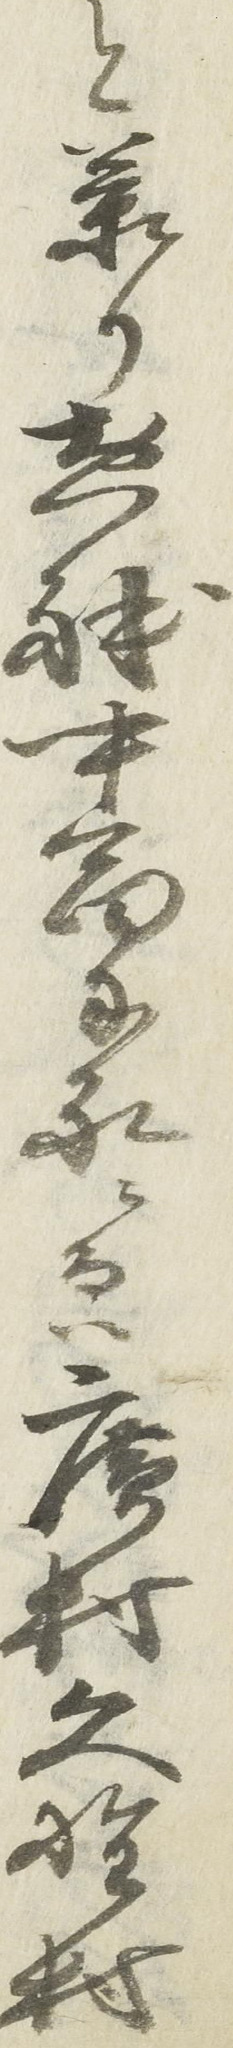と参り惣躰中富手永ニ而は広村久野村
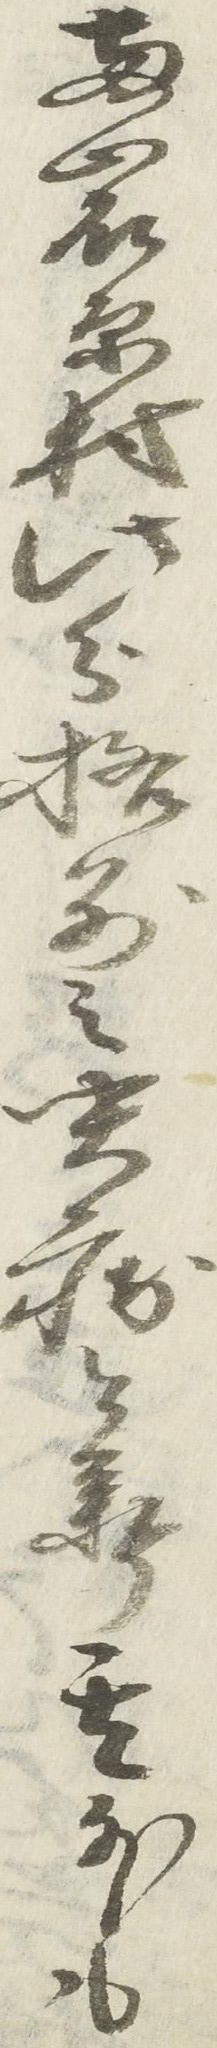両岩原村此分格別の虫病と承り其外も
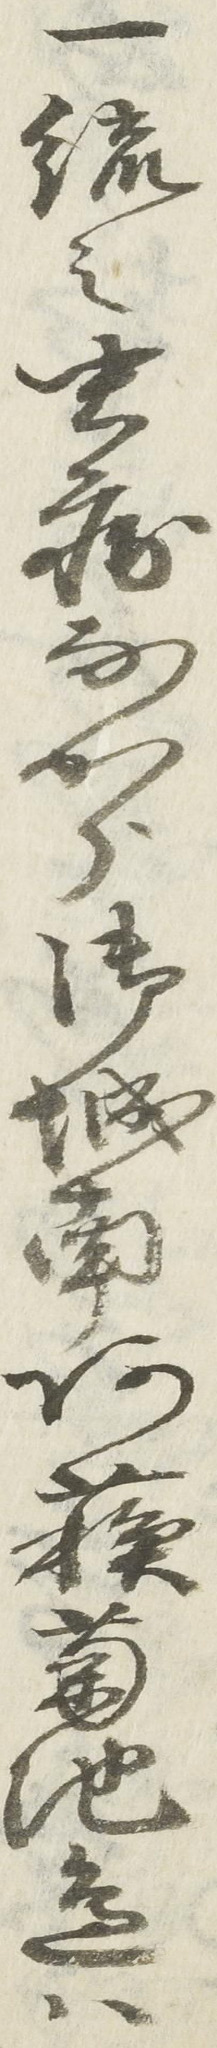一統之虫病なから御城南河萩菊池迄は
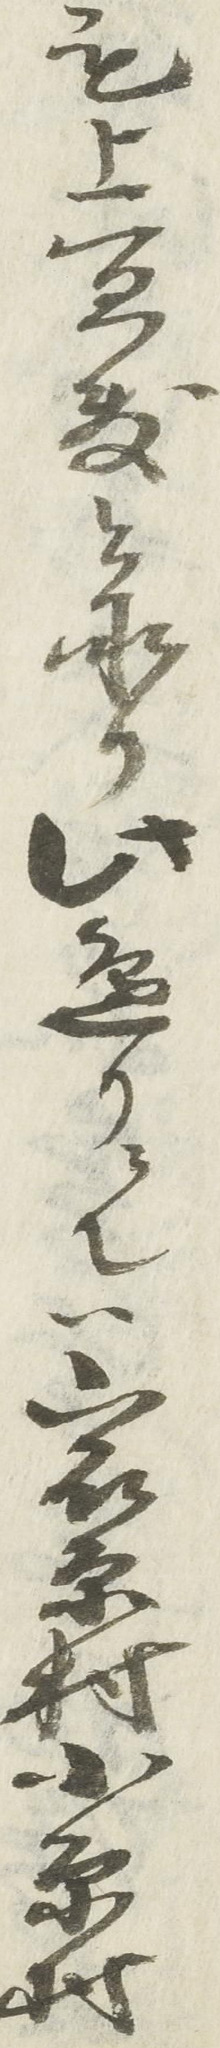是上宜敷と承り此辺りニては岩原村小原村
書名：後見笑
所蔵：東京大学地震研究所図書室 Earthquake Research Institute Library, The University of Tokyo, JAPAN
